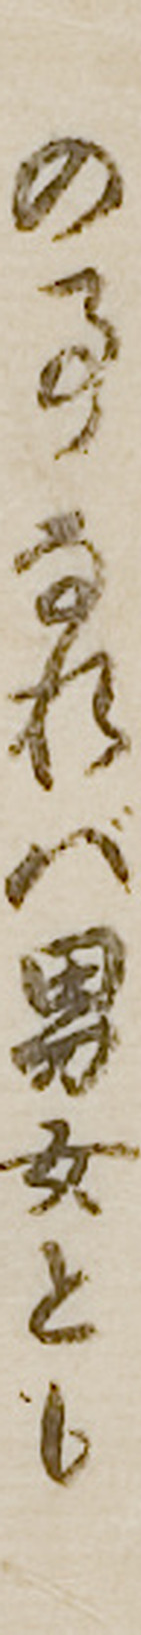の事なれば男女とも
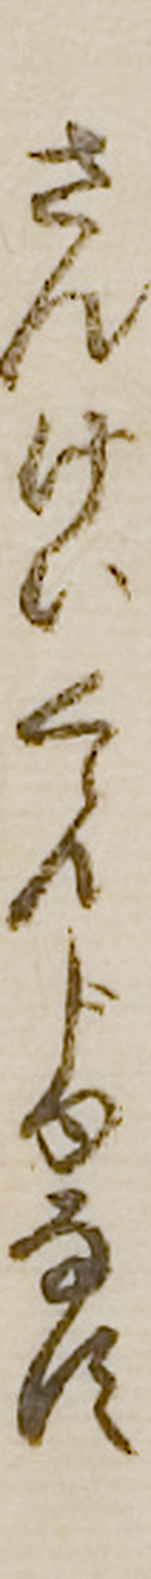さんけいくんじゆなす
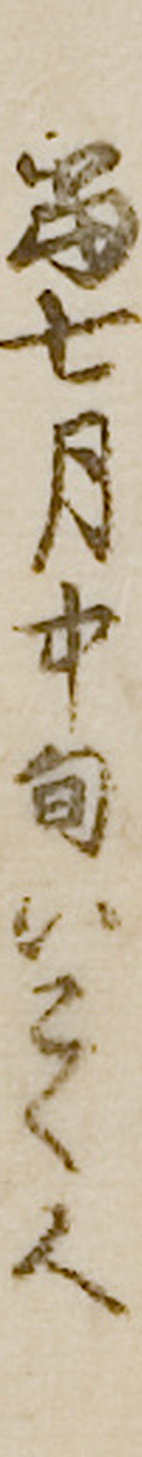当七月中旬いこく人
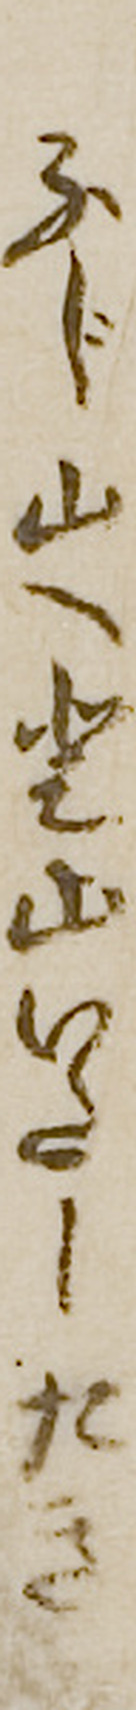ふじ山へ登山いたしたき
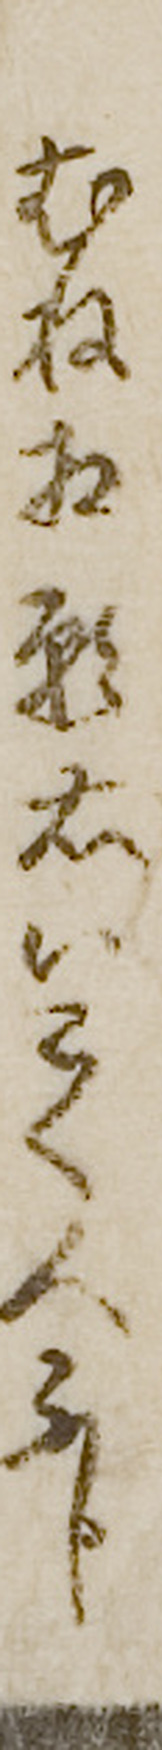むね相願右いこく人ふじ
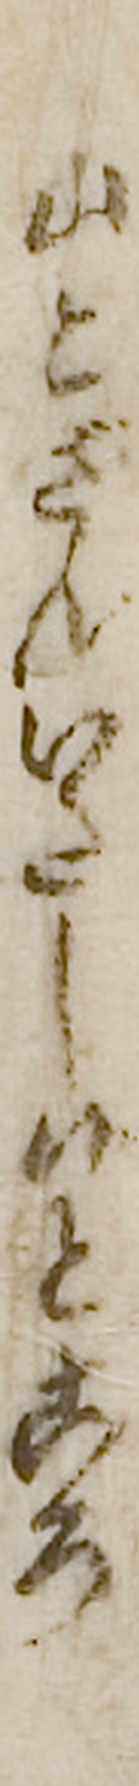山とざんいたし候ところ
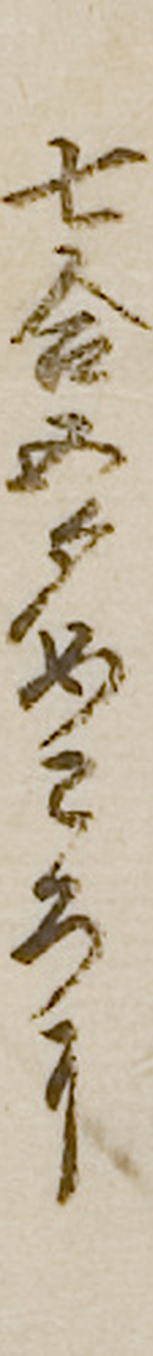七合五勺めころに
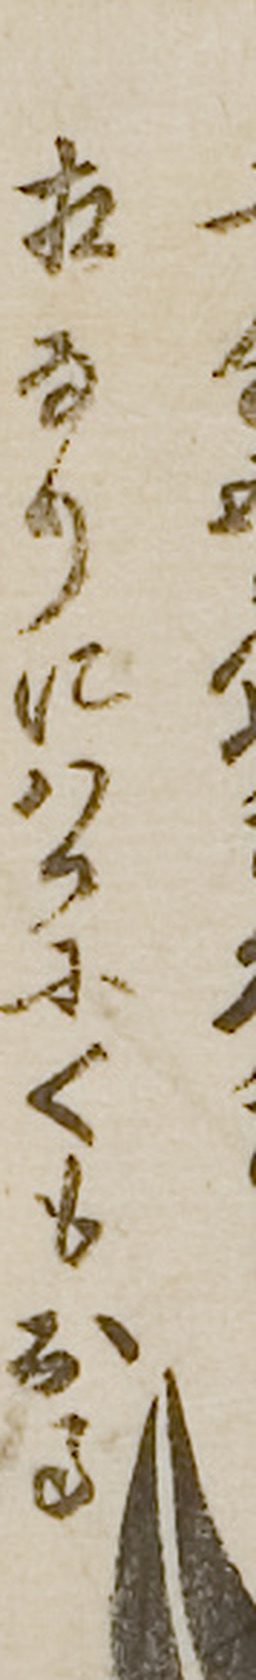相なりにはかにくも出る
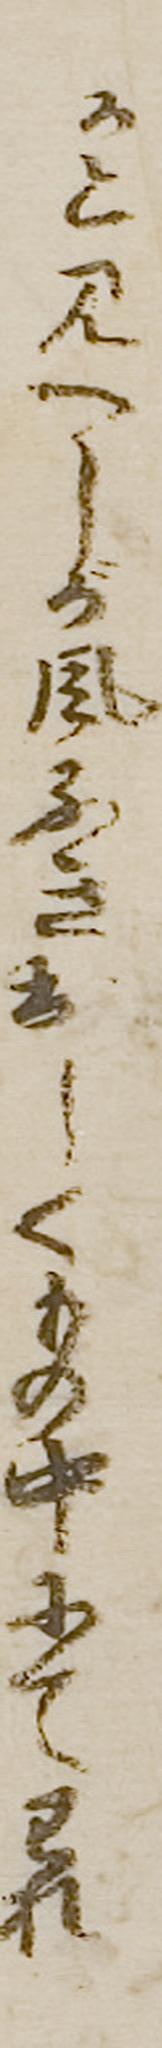かと見へしが風ふき出しくもの中にてわれ
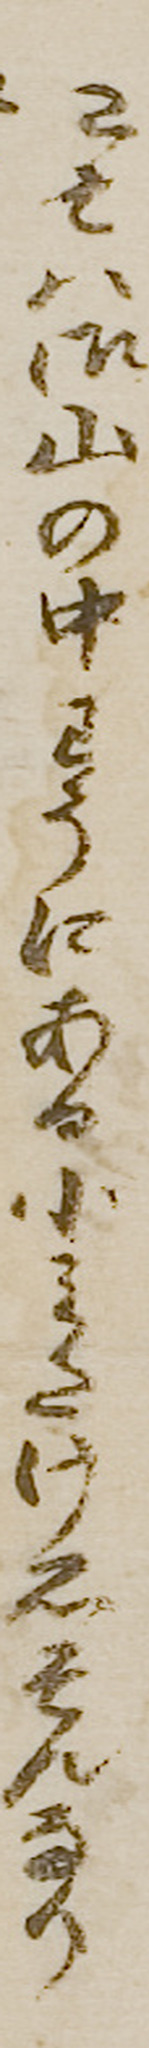こそは御山の中ころにある小みたけ石そんなり
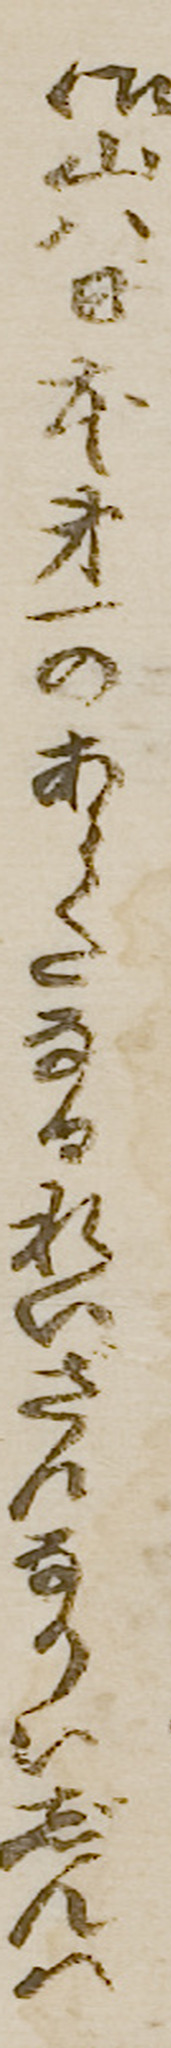御山は日本第一のあらたなるれいざんなりいじんは
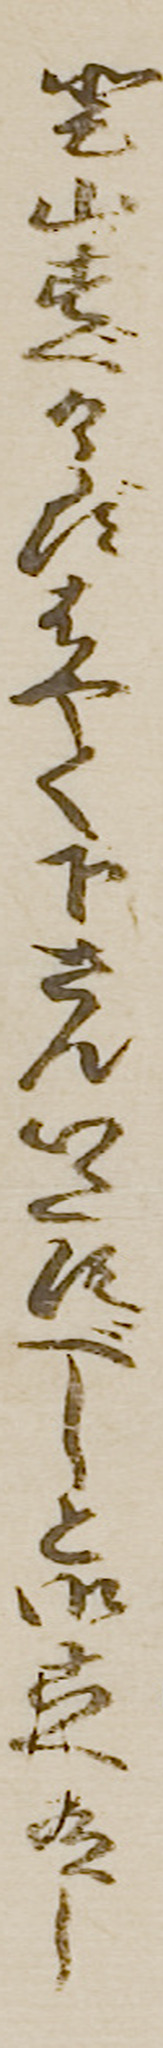登山すべからずはやく下ざんいたすべしと御こへ有し
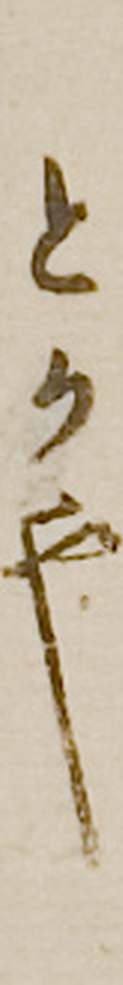とかや
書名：[富士山に異国人登山]
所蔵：東京大学総合図書館 General Library in the University of Tokyo, JAPAN
